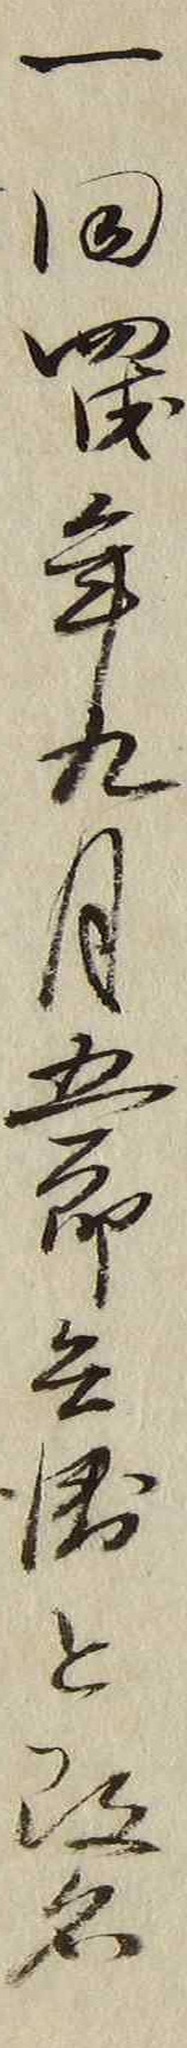一同四戌年九月五郎兵衛と改名
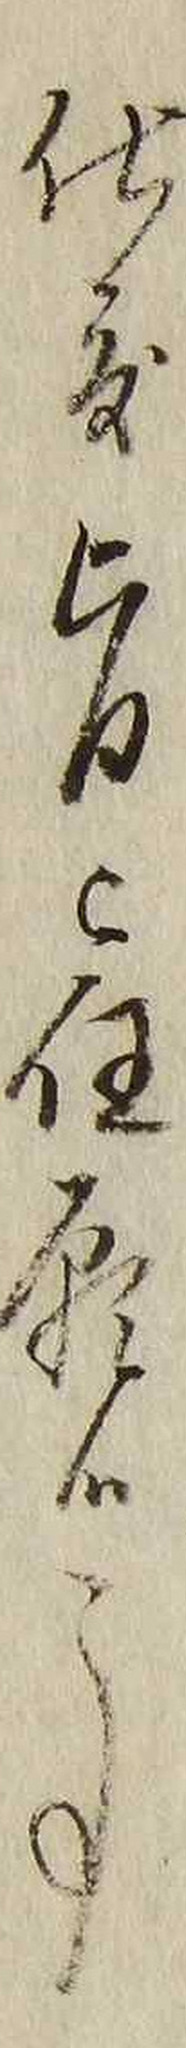仕度旨被任願候事

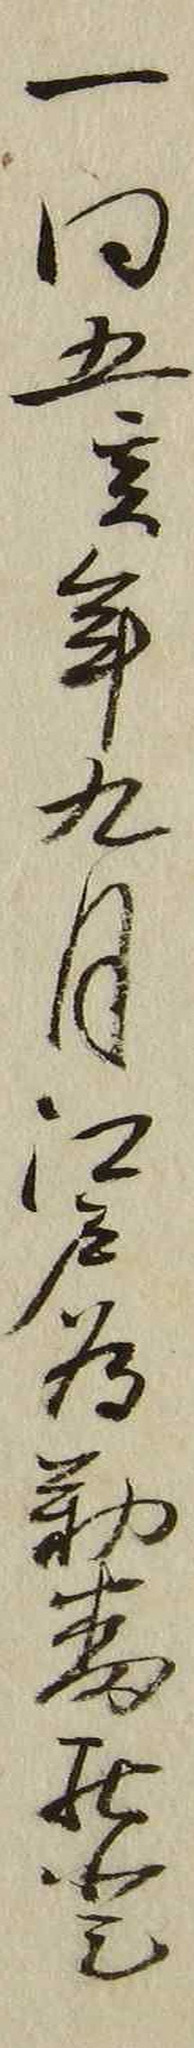一同五亥年九月江戸為勤番罷登
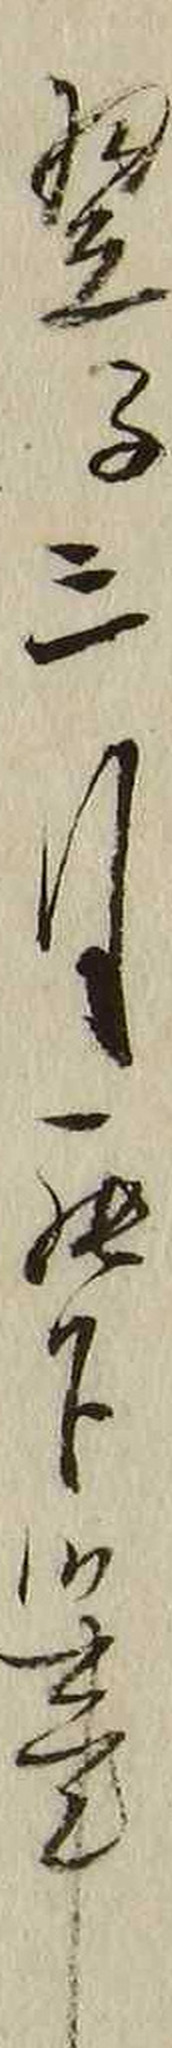翌子三月罷下候事
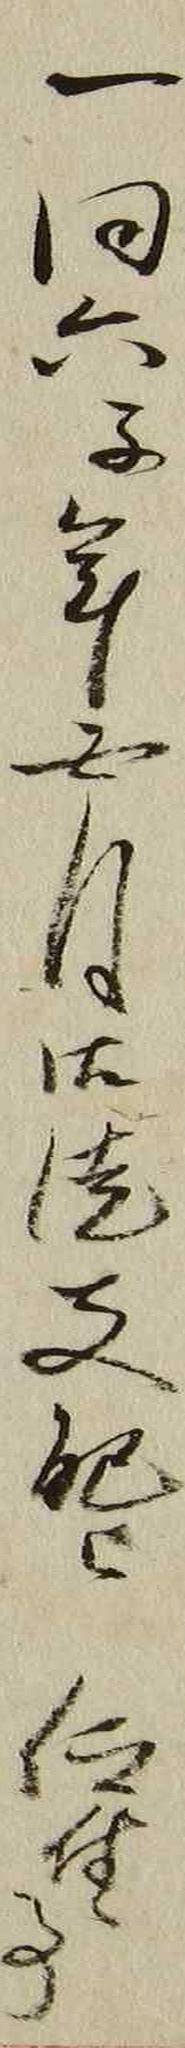一同六子年五月御徒支配被仰付候事
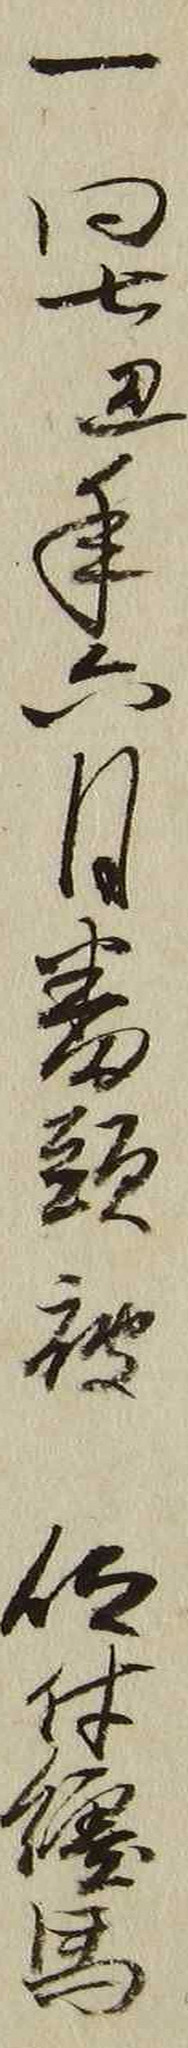一同七丑年六月番頭被仰付纏馬
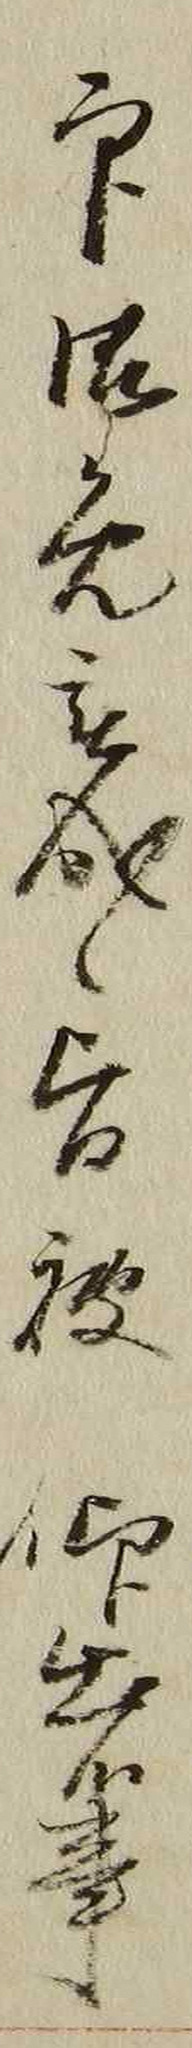印御免被成候旨被仰出候事
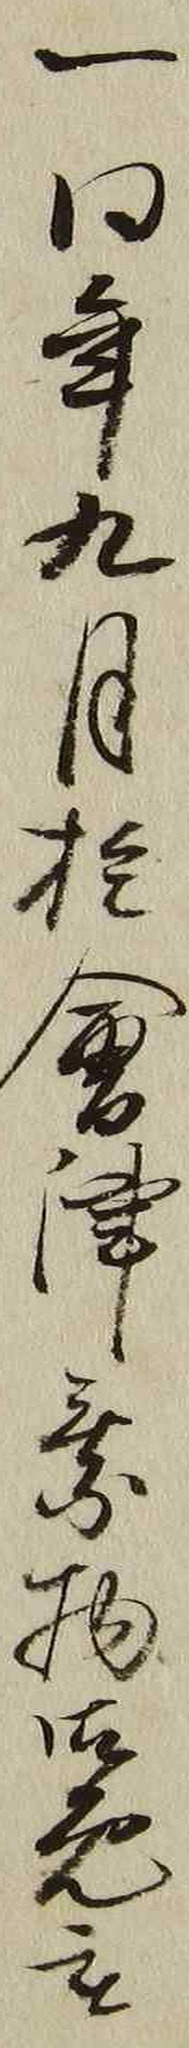一同年九月於会津乗物御免被
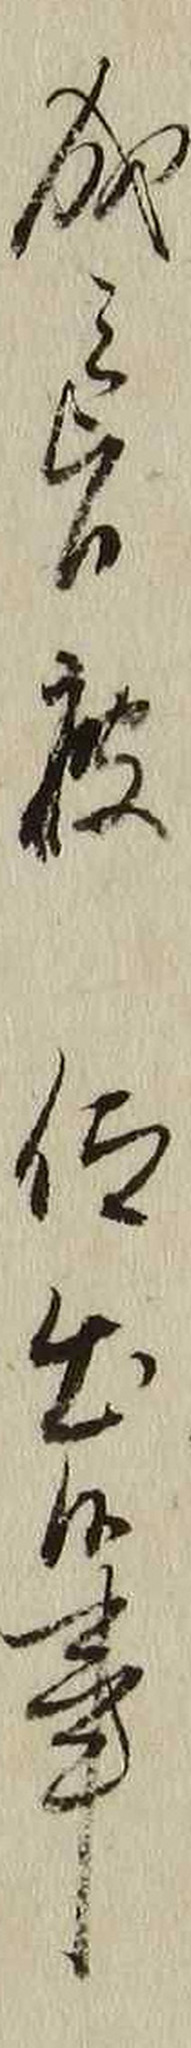成之旨被仰出候事
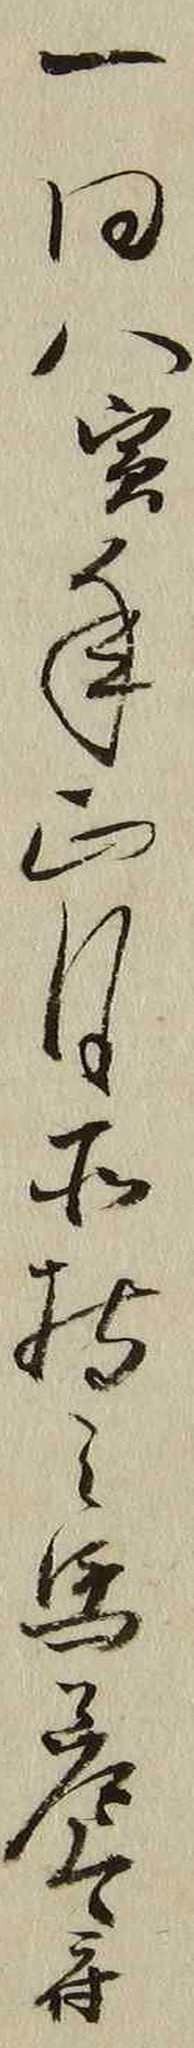一同八寅年正月所持之馬差上候ニ付
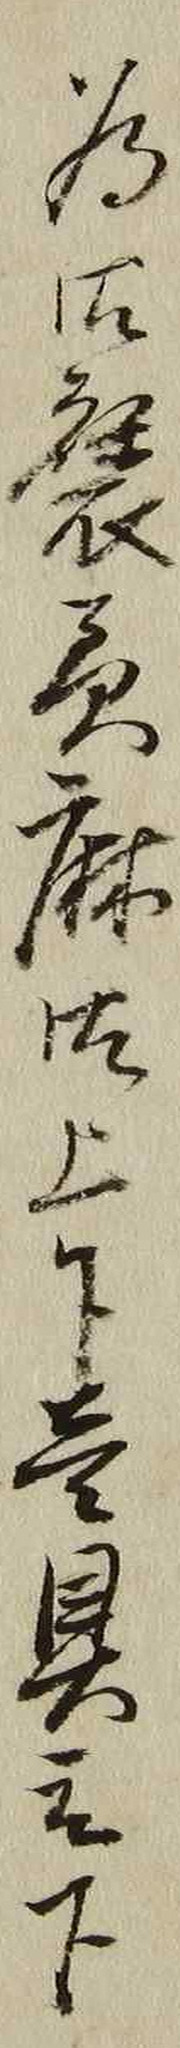為御褒美麻御上下壱具被下
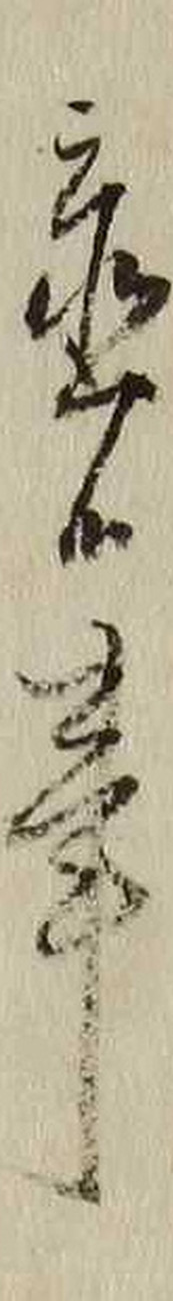置候事
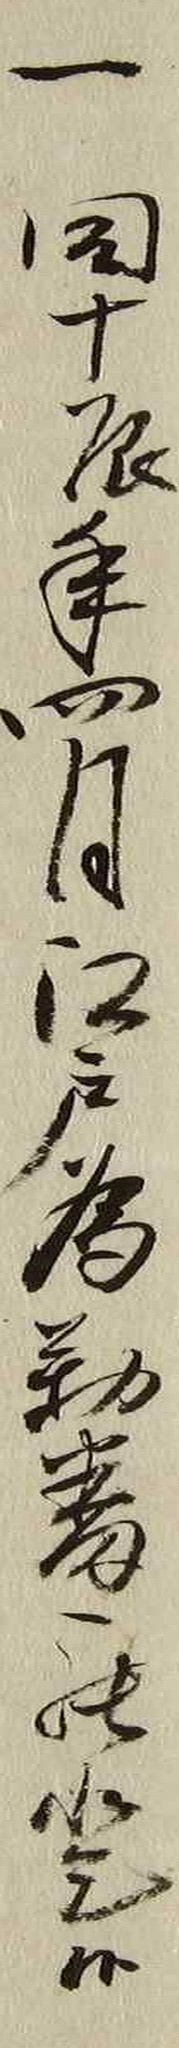一同十辰年四月江戸為勤番罷登候
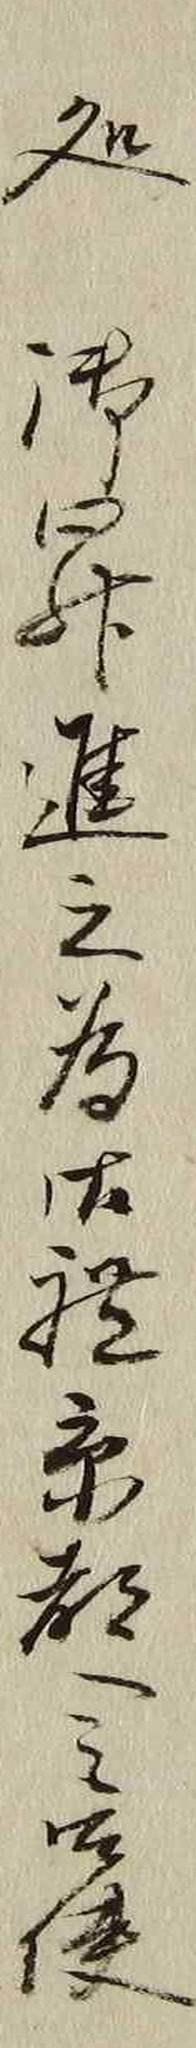処御昇進之為御礼京都へ之御使
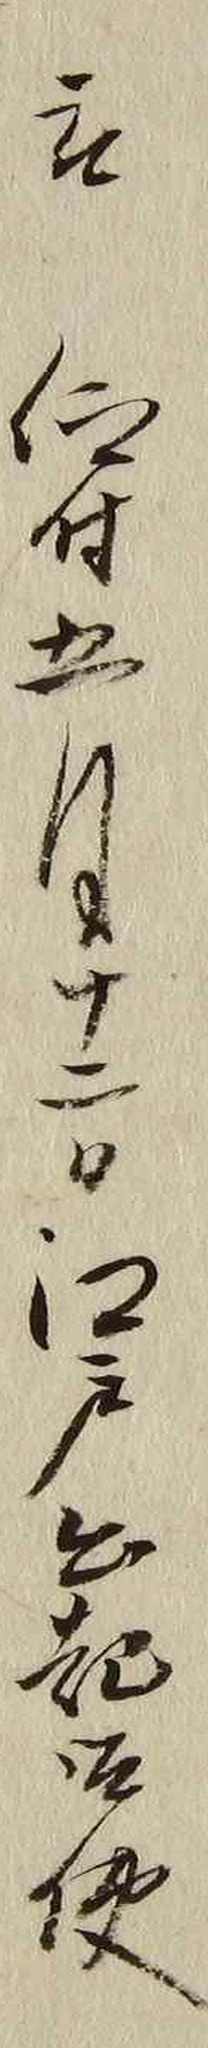被仰付五月十二日江戸出起御使
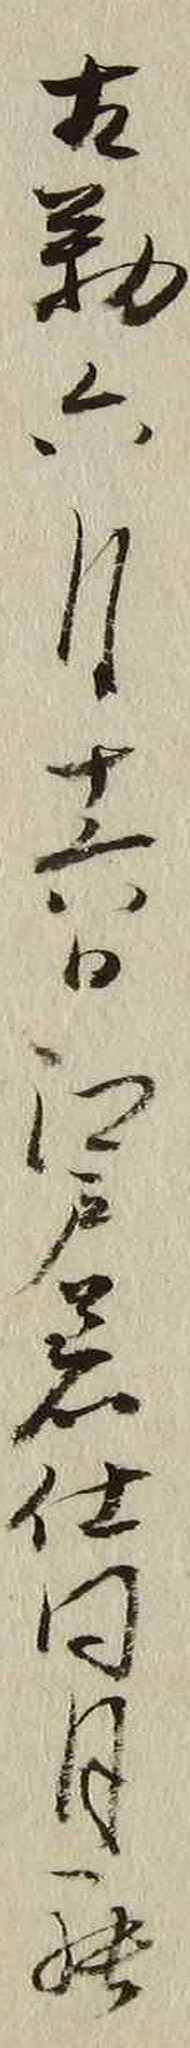相勤六月十六日江戸着仕同月罷
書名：諸士系譜　巻之351　す之部1
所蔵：会津若松市立会津図書館
